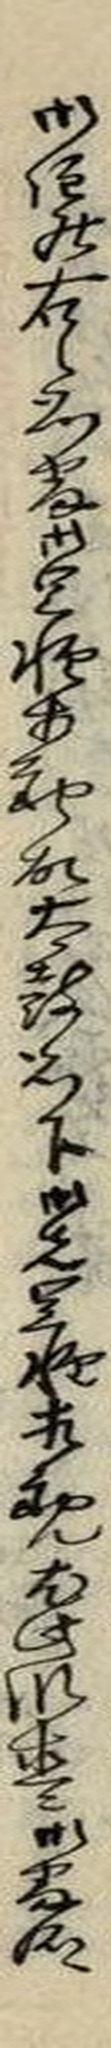御住居右之御門番御足軽相勤候故太鼓御門下御先足軽相勤ル尤此段直ニ御番所へ
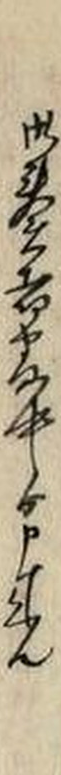御奏者番中ゟ申来ル
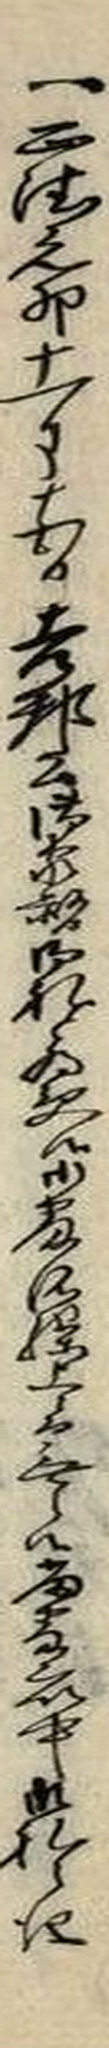一正徳元卯十一月十五日吉邦公御家督御礼被為受候御番所繰上にて無之候当番衆中御礼之儀
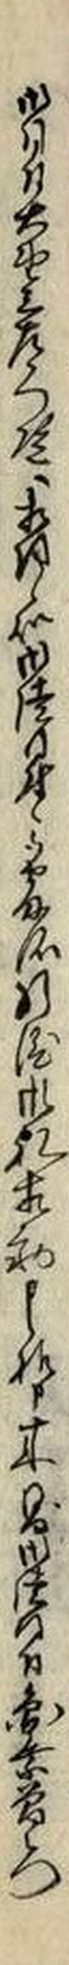御目付大野三左衛門殿へ相伺候処御徒目付へ御番所引渡御礼相勤申候様申来則御徒目付円乗曽右衛門
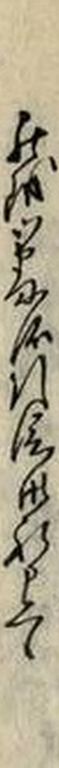罷越御番所引渡御礼申上候
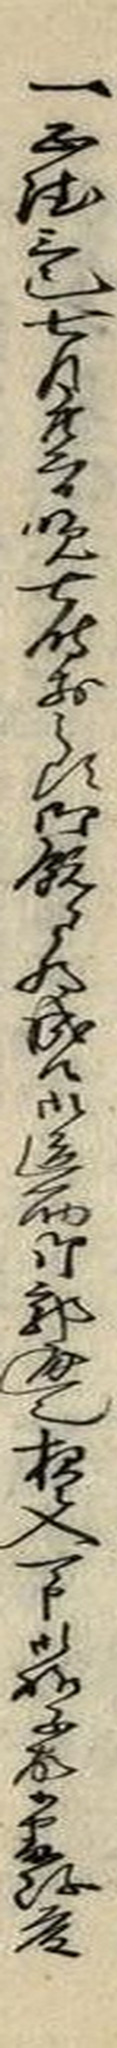一正徳三巳七月廿二日晩七時前之比御厩へ被為成候御道筋御郭通也夜に入可申御様子故御番改藤
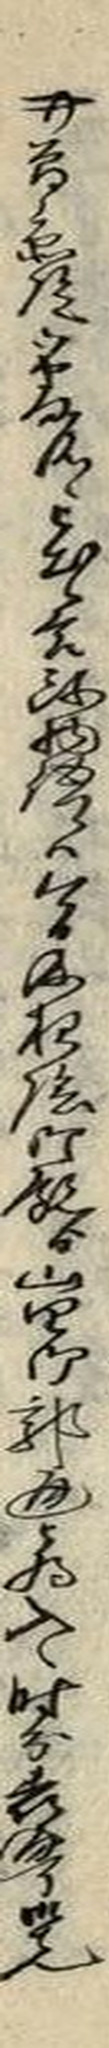井曽兵衛殿御番所へ被出候節致物語候は今日及夜陰御厩ゟ山里御郭通被為入候時分表通り御先
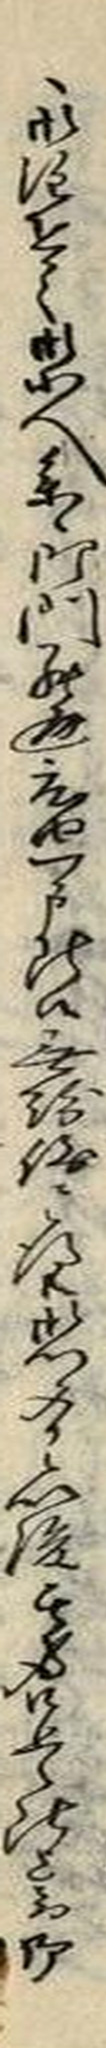へ御注進之御小人参候御門罷通度由可申断候無紛儀に候得共御門〆り候以後其身口上之断迄にて御
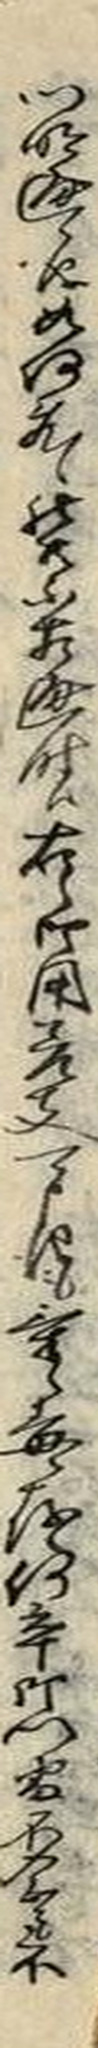門明通候儀如何敷候然共不相通時は右之御用差支可申儀も気之毒ニ存候何卒御門番不念にも不
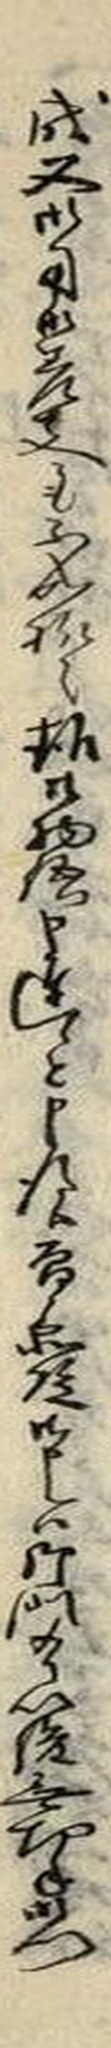成又御用御差支にも不成様之趣御物語申達候と申候得は曽兵衛殿被申候は御門〆り以後無切手御門
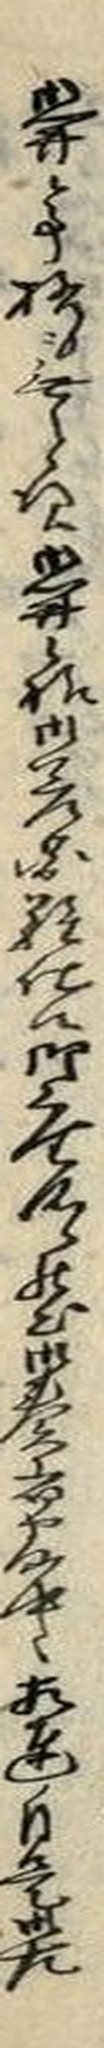御開候事格も無之候得は御開候様御差図難仕候御座所へ罷出御奏者番中へ相達自是御左
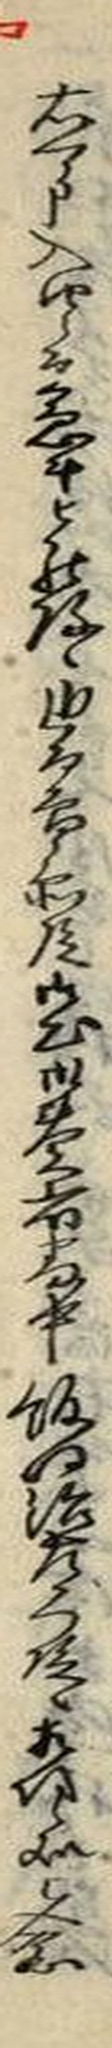右可申入由にて急き被罷帰候追て曽兵衛殿御出御奏者番中飯田治左衛門殿へ相伺候処被入念

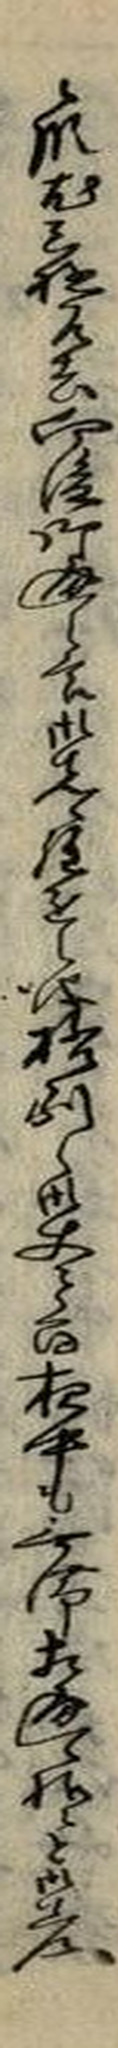候段尤至極乍去向後御通之節御先へ注進之儀格別之御使に候間夜中も無滞相通候様にと御差
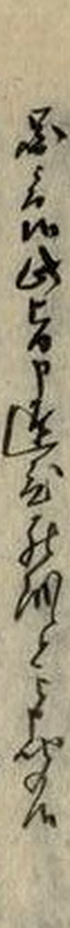図に而候此旨申達置罷越候と被申聞候
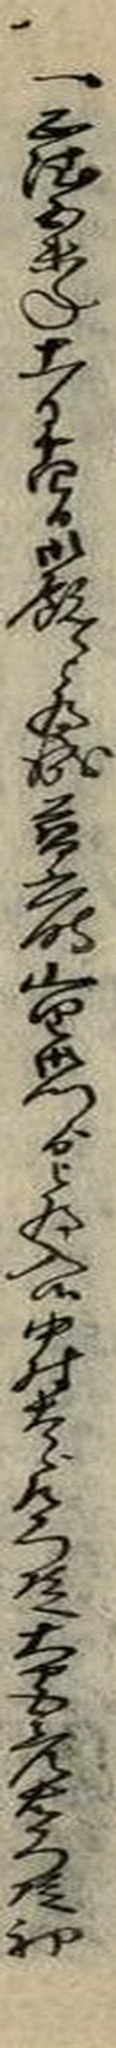一正徳五未年十一月十四日御厩へ被為成暮六時山里御門ゟ被為入候中村太郎左衛門殿大宮彦右衛門殿初
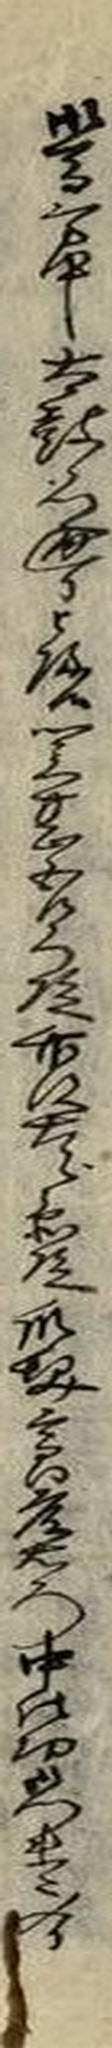御馬方中太鼓御門通り被帰候関甚五左衛門殿竹沢太郎兵衛殿爪髪高田藤右衛門中仕切御門未た〆り
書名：御門御櫓之部
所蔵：福井県文書館 Fukui Prefectural Archives
